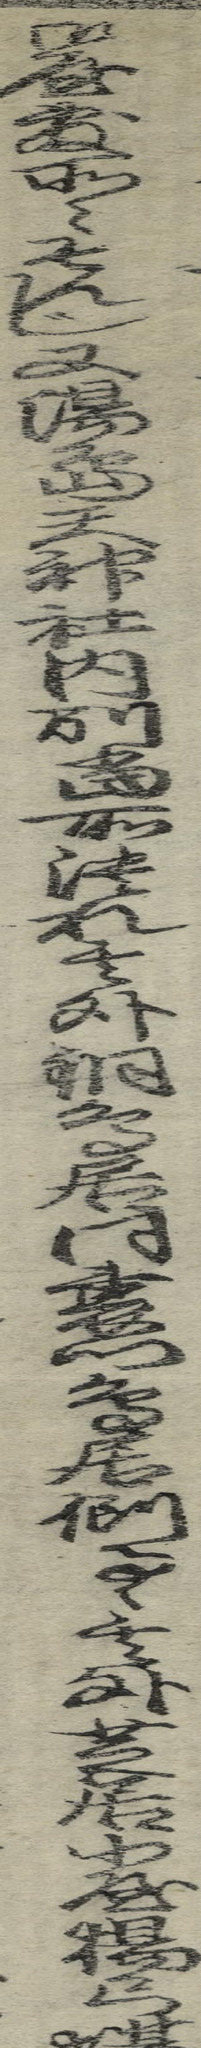御屋敷所々そんじ又湯嶋天神社内別当所潰れ其外銅鳥居同裏門鳥居倒るゝ其外芝居小屋揚弓場
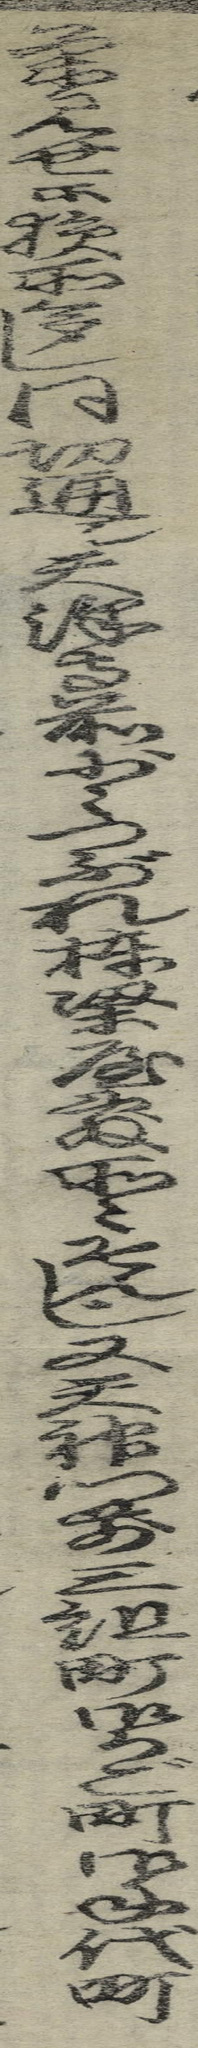茶見せ等損所多し同切通し天源寺前少々つぶれ棟梁屋敷所々そんじ又天神門前三組町御かご町御子代町
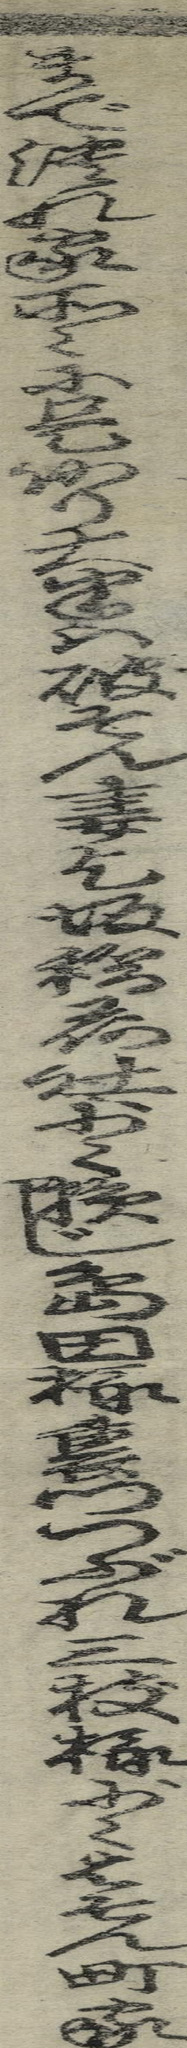まで潰れ家所々に是あり大半は破そん妻乞坂稲荷社少々損じ嶋田様裏門つぶれ三枝様少々はそん町家
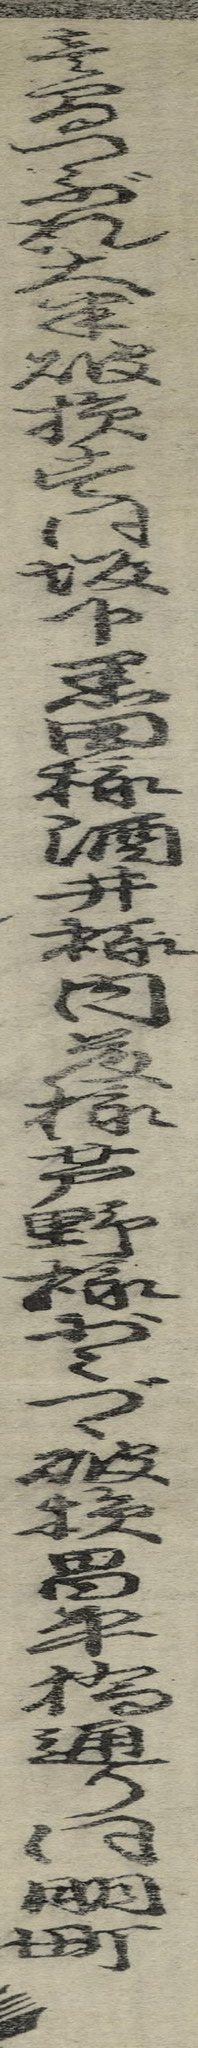壱間つぶれ大半破損す同坂下黒田様酒井様内藤様芦野様少々つゝ破損昌平橋通り同朋町
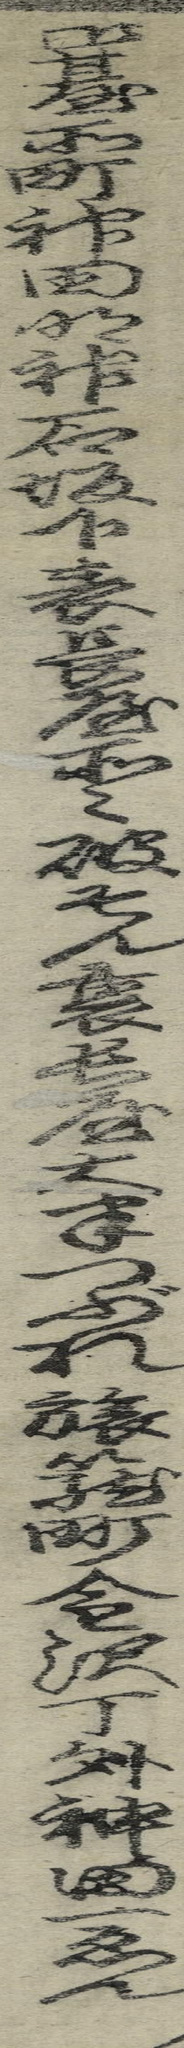御台所町神田明神石坂下表長屋所々破そん裏長屋大半つぶれ旅籠町金沢町外神田一ゑん
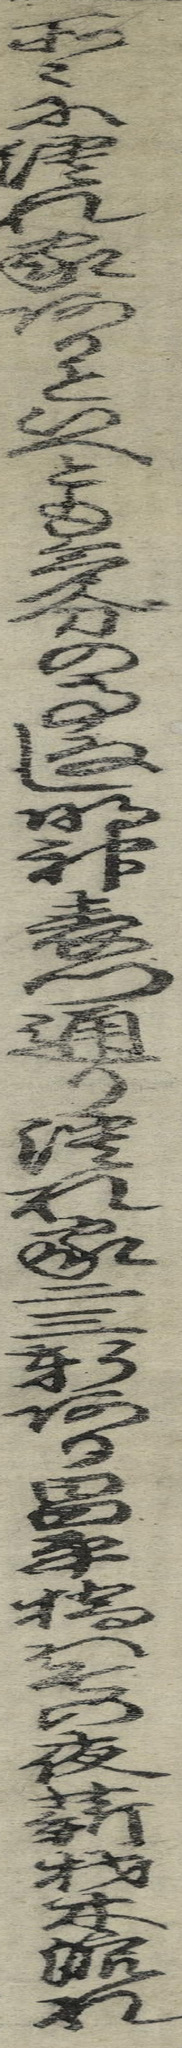所々に潰れ家ありといへども多分のことなし明神表門通り潰れ家二三軒あり昌平橋はその夜薪材木流れ
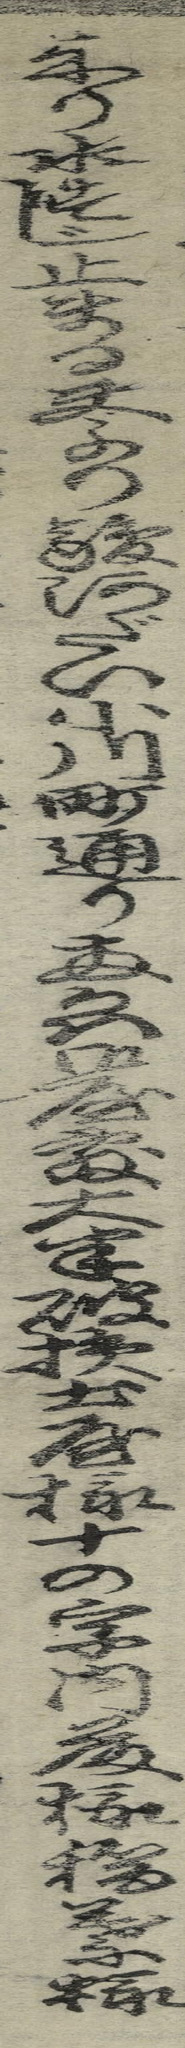来り水すじ止まる夫より駿河だい小川町通り兩かは御屋敷大半破損土屋様十の字内藤様稲葉様
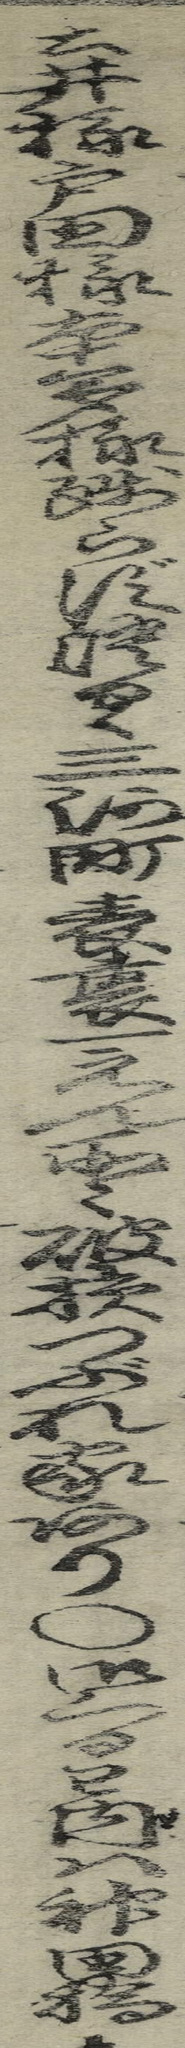土井様戸田様本多様残らず潰るゝ三河町表裏一えん所々破損つぶれ家あり◯御くるわ内は神田橋
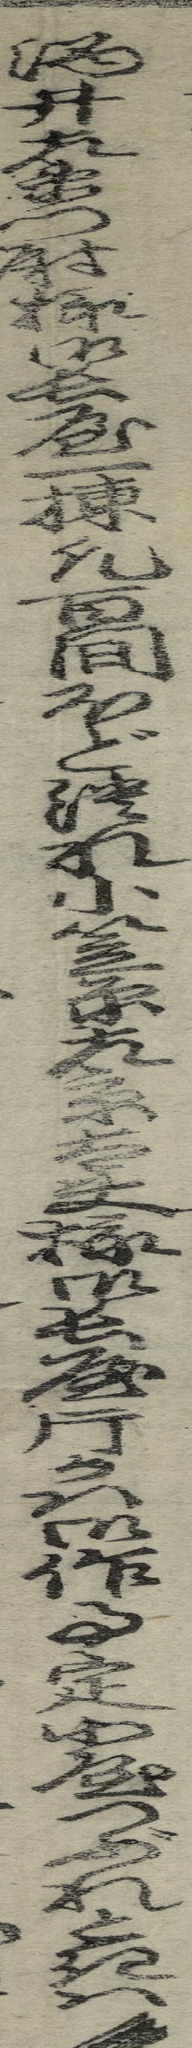酒井左衛門尉様御長屋一棟凡百間ほど潰れ小笠原左京太夫様御長屋片かは御作事定小屋つぶれときは
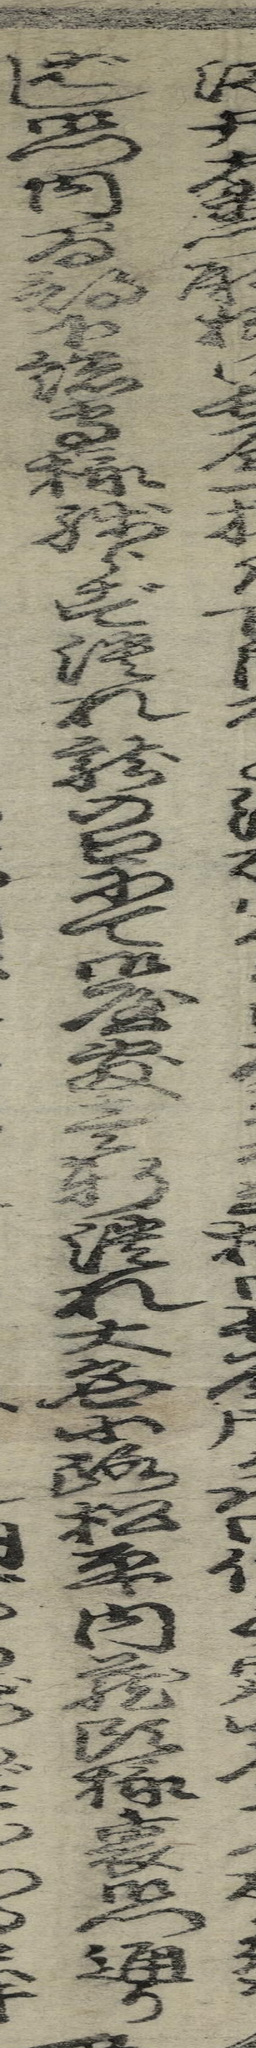ばし御門内間部下総守様残らず潰れ龍の口にて御屋敷壱軒潰れ大名小路松平内蔵頭様裏御門通り
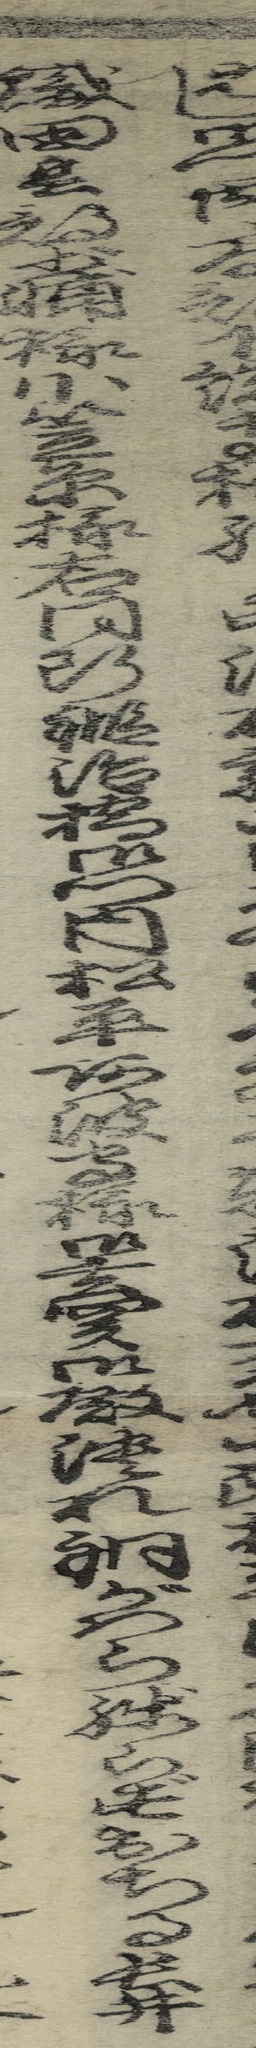織田兵部少輔様小笠原様右同断鍛冶橋御門内松平阿波守様御玄関御殿潰れ銅がはら残らずおちる長井
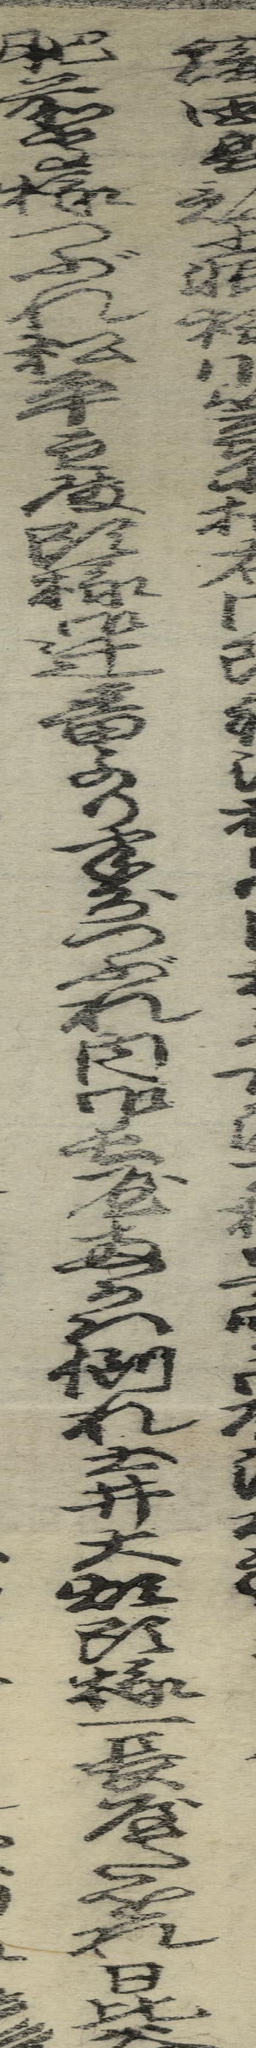肥前守様つぶれ松平主殿頭様御辻番より半分つぶれ内御長屋兩かは倒れ土井大炊頭様一長屋たをれ日比谷
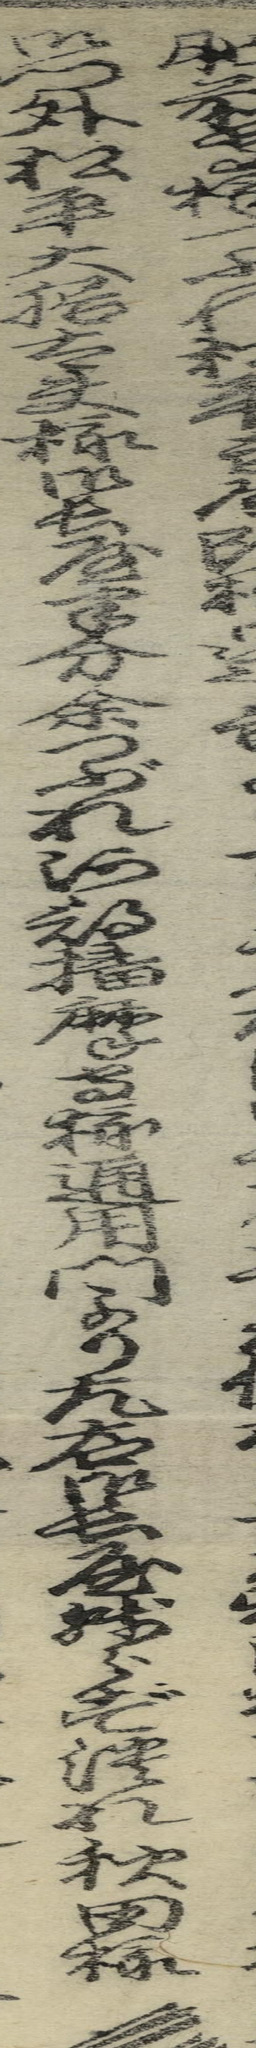御門外松平大膳太夫様御長屋半分余つぶれ阿部播磨守様通用門より左右御長屋残らず潰れ秋田様
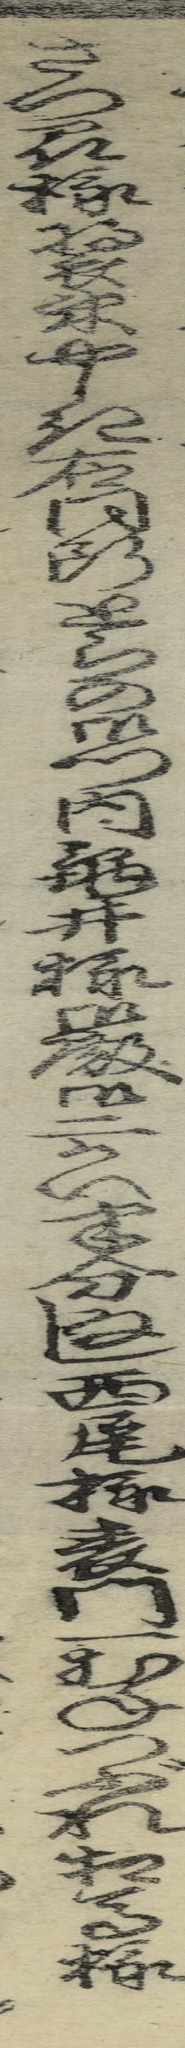さつ州様装束やしき右同断とらの御門内亀井様御殿御二かい半分なし西尾様表門一むねつぶれ相馬様
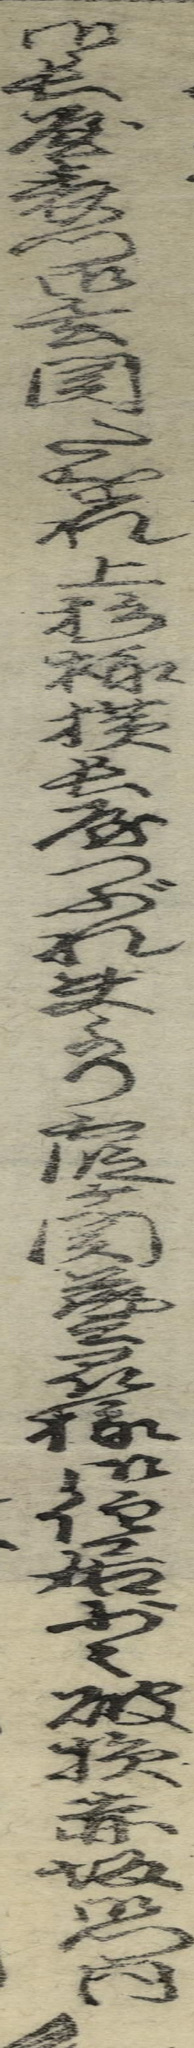御長屋表門御玄関たをれ上杉様横長屋つぶれ夫より霞ヶ関藝州様御住居少々破損赤坂御門内
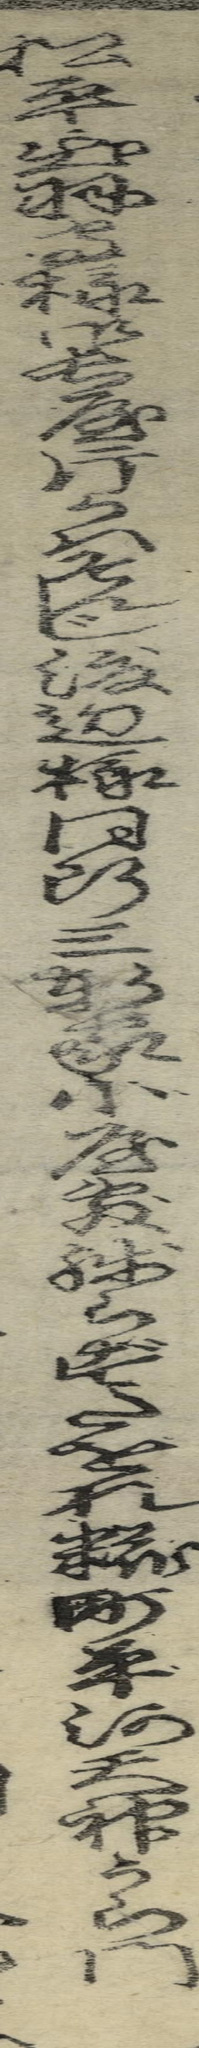松平出羽守様御長屋片かはそんじ渡辺様同断三軒家小屋敷残らずたをれ糀町平河天神うら門
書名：江戸十里四方大風出水焼失　場所附
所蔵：東京大学地震研究所図書室 Earthquake Research Institute Library, The University of Tokyo, JAPAN
